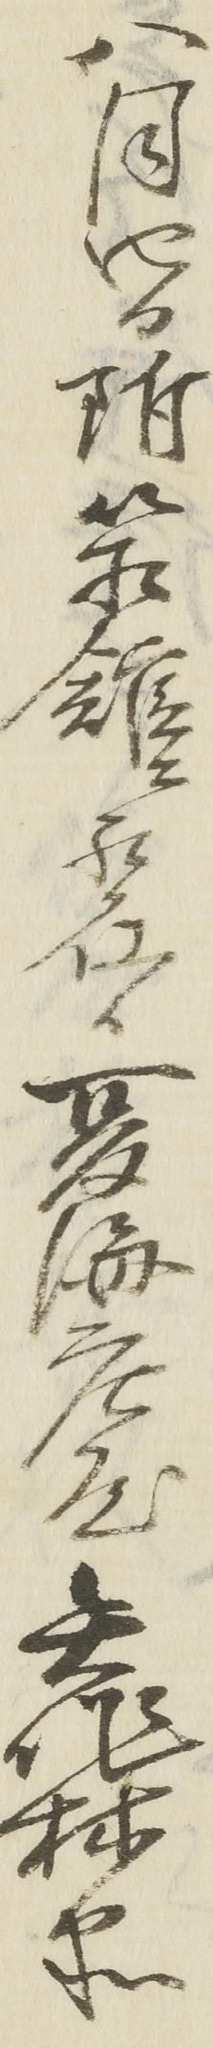八月四日附箱館ニ罷在候夏海庄屋矢作林衛
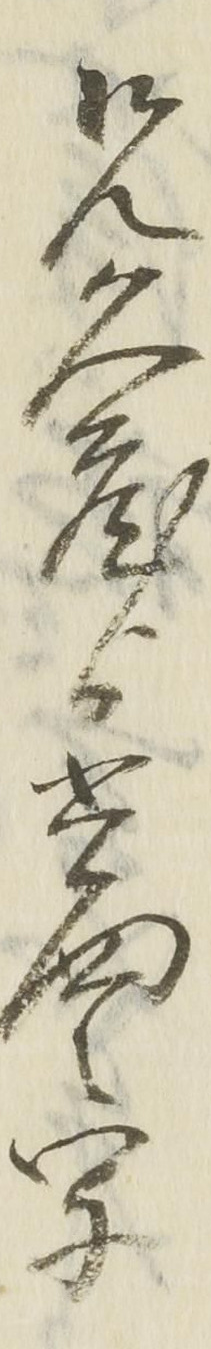児久蔵ゟ書面之写
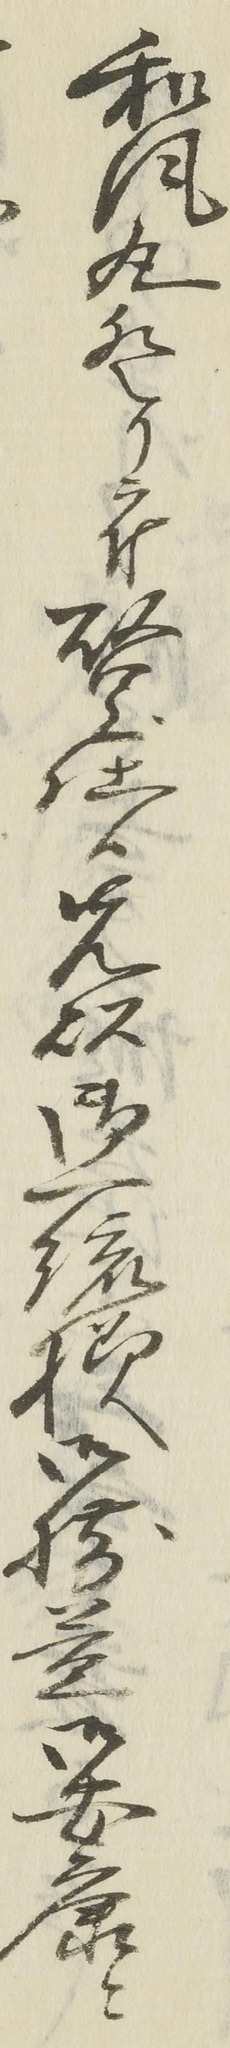和風丸登りニ付啓上仕候先以御一統様御勝益御安康と
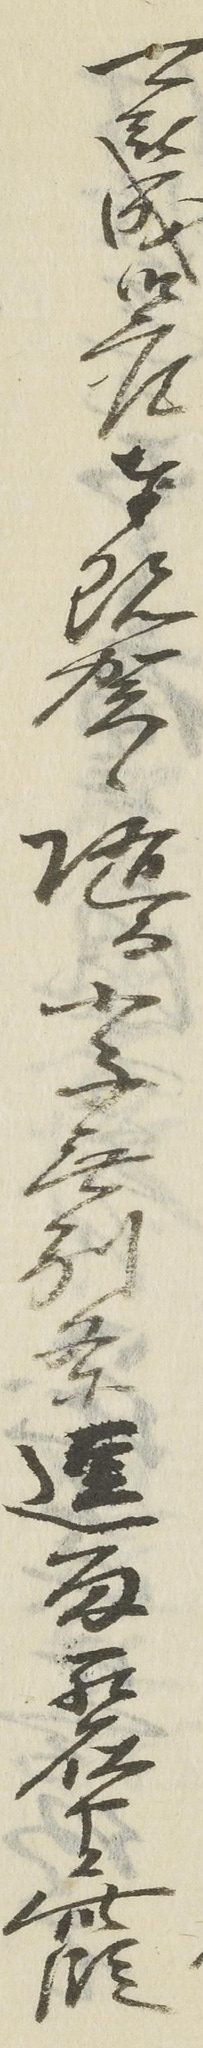可被成御座奉既賀候随而小子無別条逗留罷在申候此段
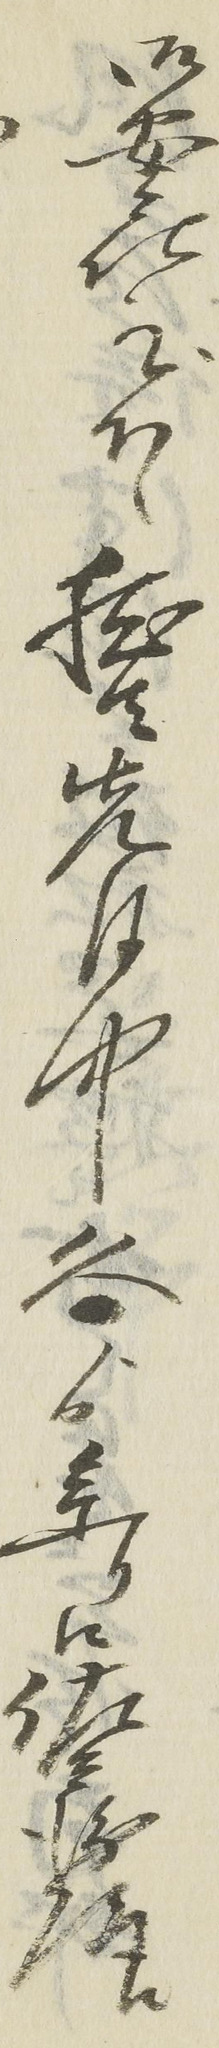御安喜被下候然は先月中谷ゟ参り候佐兵衛殿江
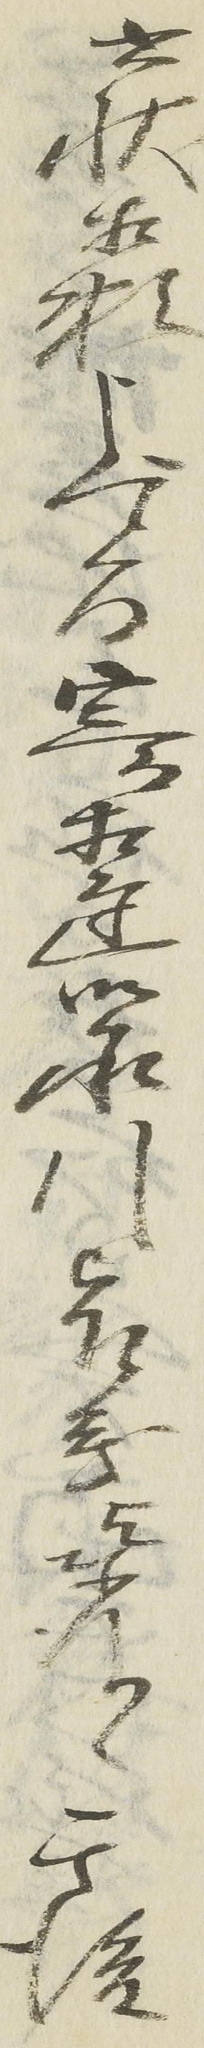書状相頼申上候間定而相達御承引被下候義と奉存候其後
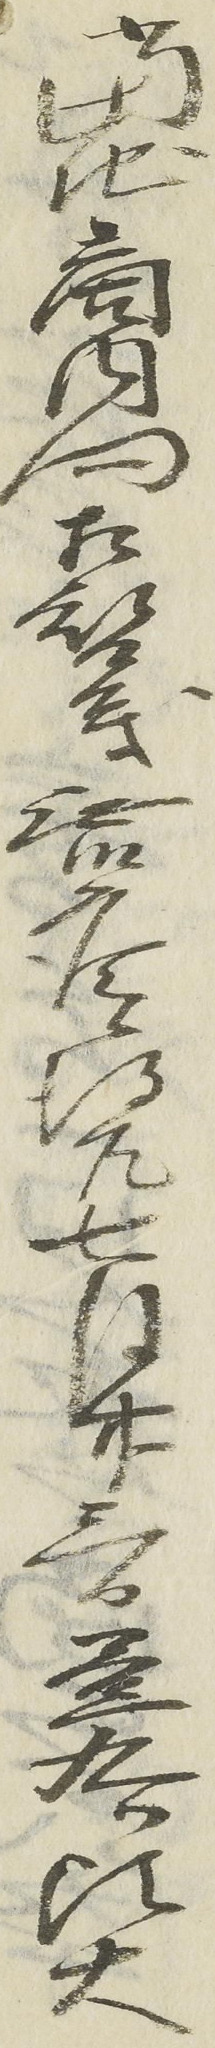当地啇内向相替義無御座候得共七月廿三日昼九ツ比大
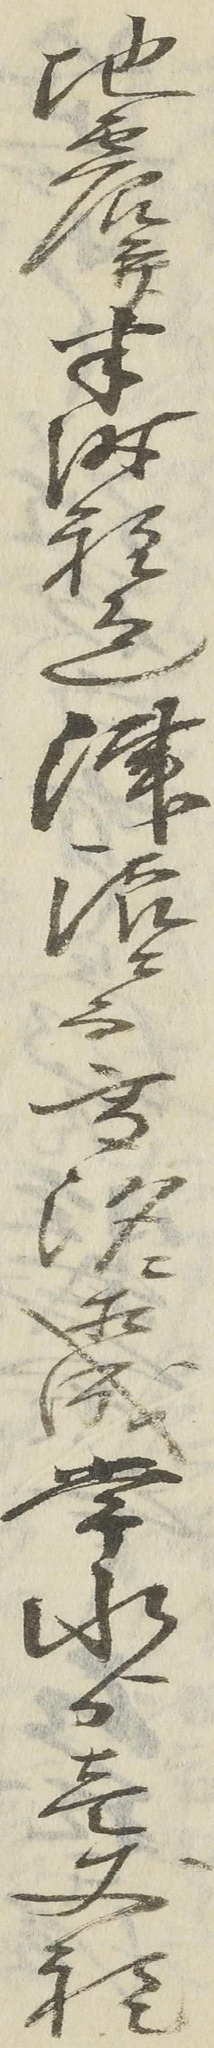地震并半時程過津浪ニ而高汐ニ相成常水ゟ壱丈程

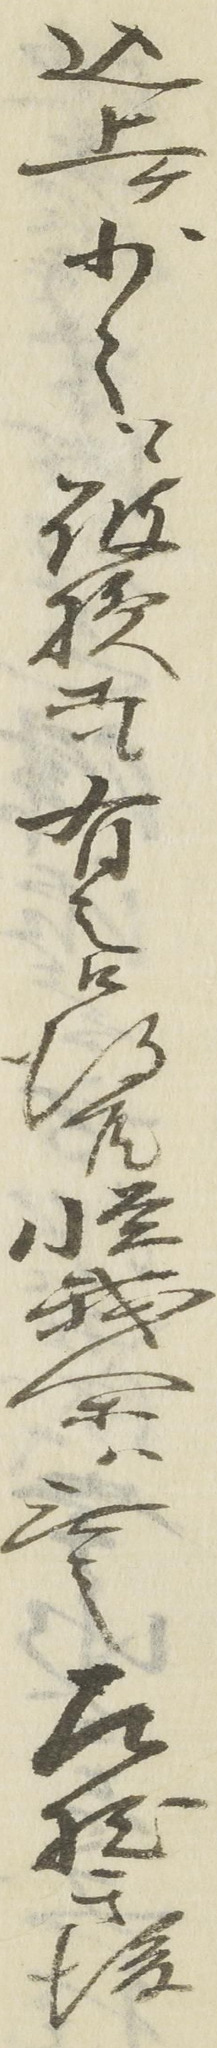込上ケ少しツヽ破損等も有之候得共怪我人等ハ無之左程其後
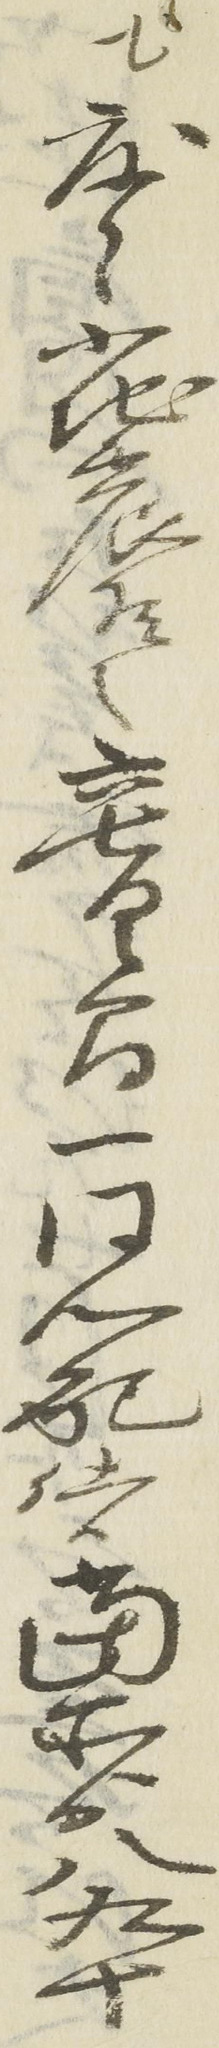も度〻小地震有之六七日之間一同心配仕候当所ゟ八九十
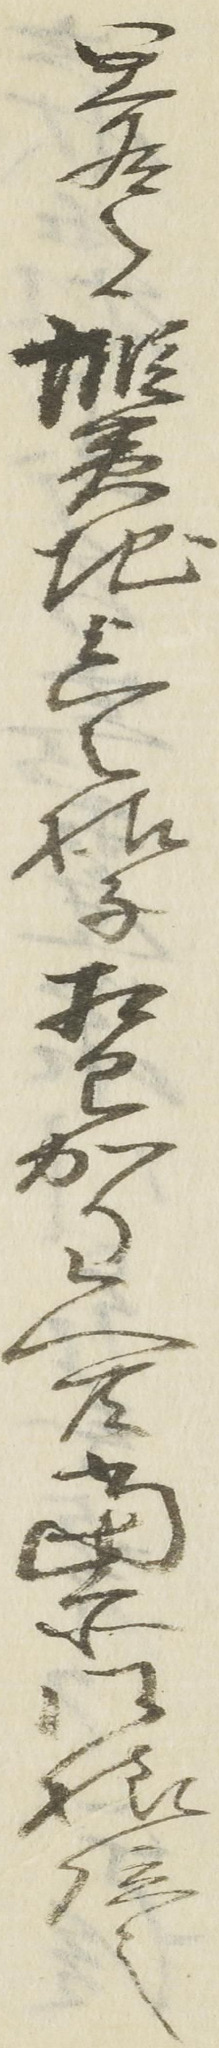里有之候蝦夷地迄之様子相わかり候へ共当所同様位之
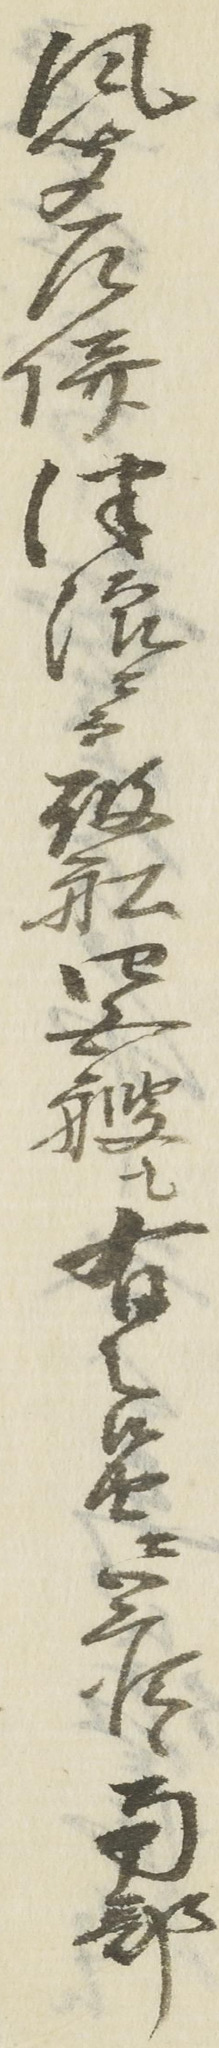風聞左併津浪ニ而破船四五艘も有之候由ニ御座候南部
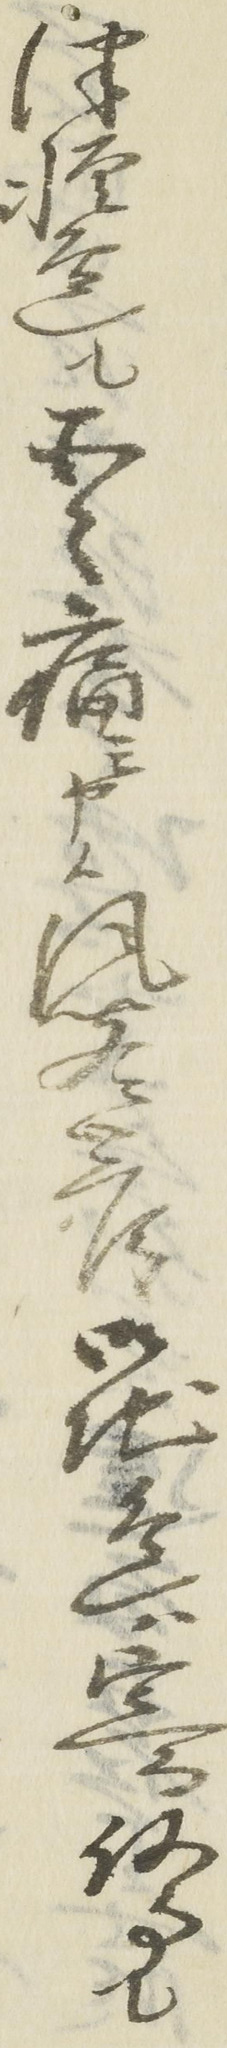津軽辺も所〻痛ミ申候風聞ニ御座候御地辺ハ定而何事も
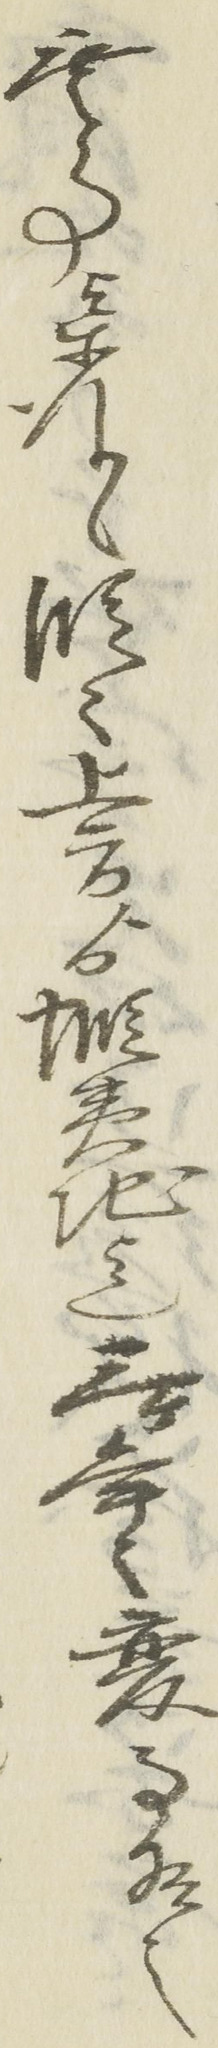無事と奉存候段〻上方ゟ蝦夷地迄三ケ年之変事有之
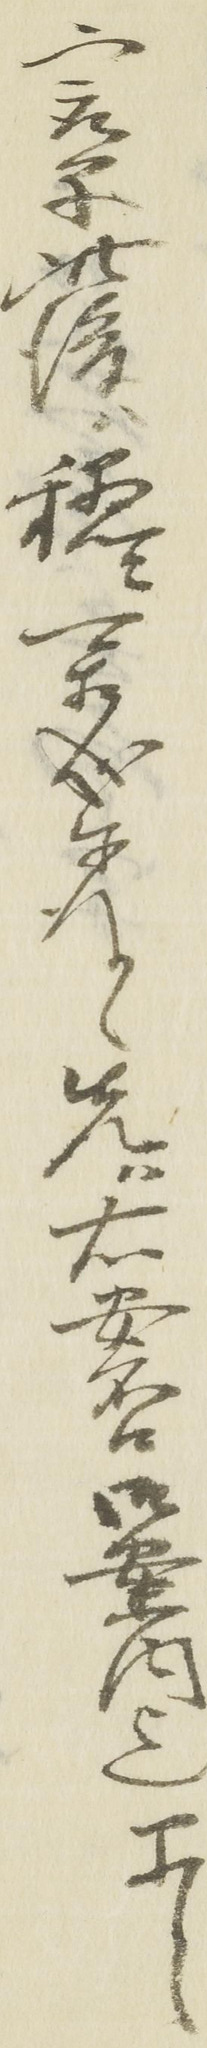最早此後ハ穏ニ可相成奉存候先ハ右安否御案内迄早〻
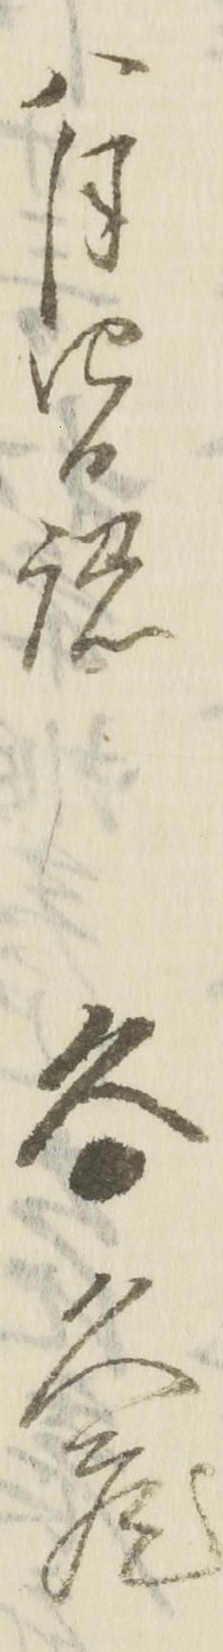八月四日認谷久蔵
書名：安政乙卯江戸大地震筆記　安政丙辰八月大阪大雷雨之記追加　安政三辰年七月松前辺大地震并八月大風雨記録
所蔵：東京大学地震研究所図書室 Earthquake Research Institute Library, The University of Tokyo, JAPAN
